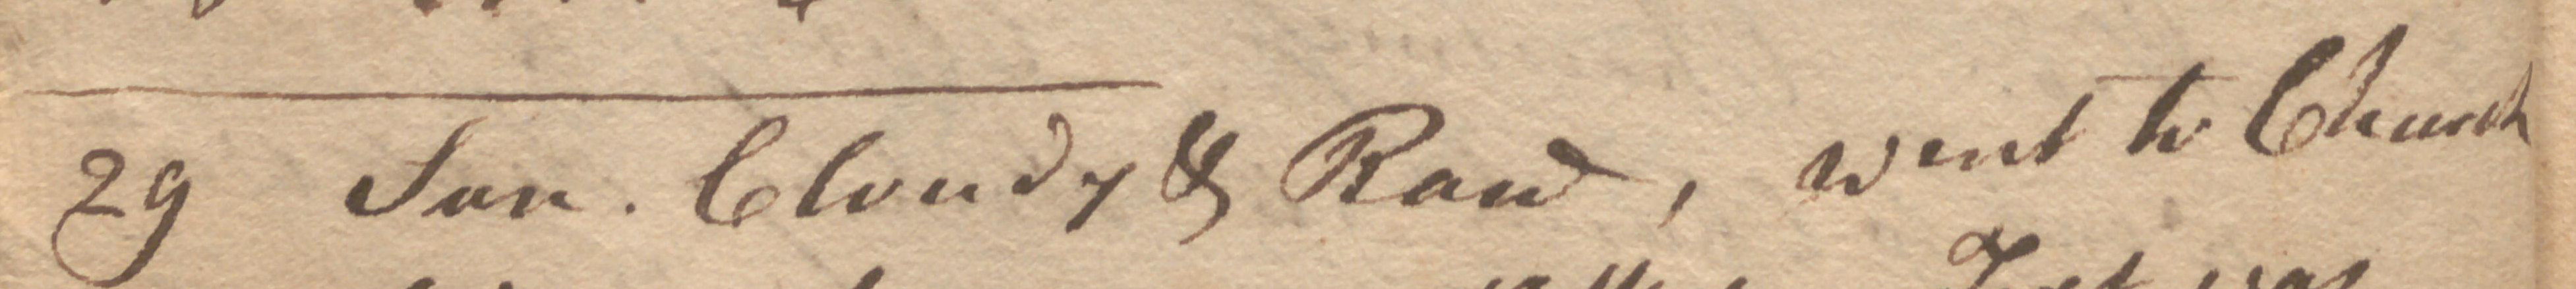29 Sun. Cloudy & Raw, went to Clurch
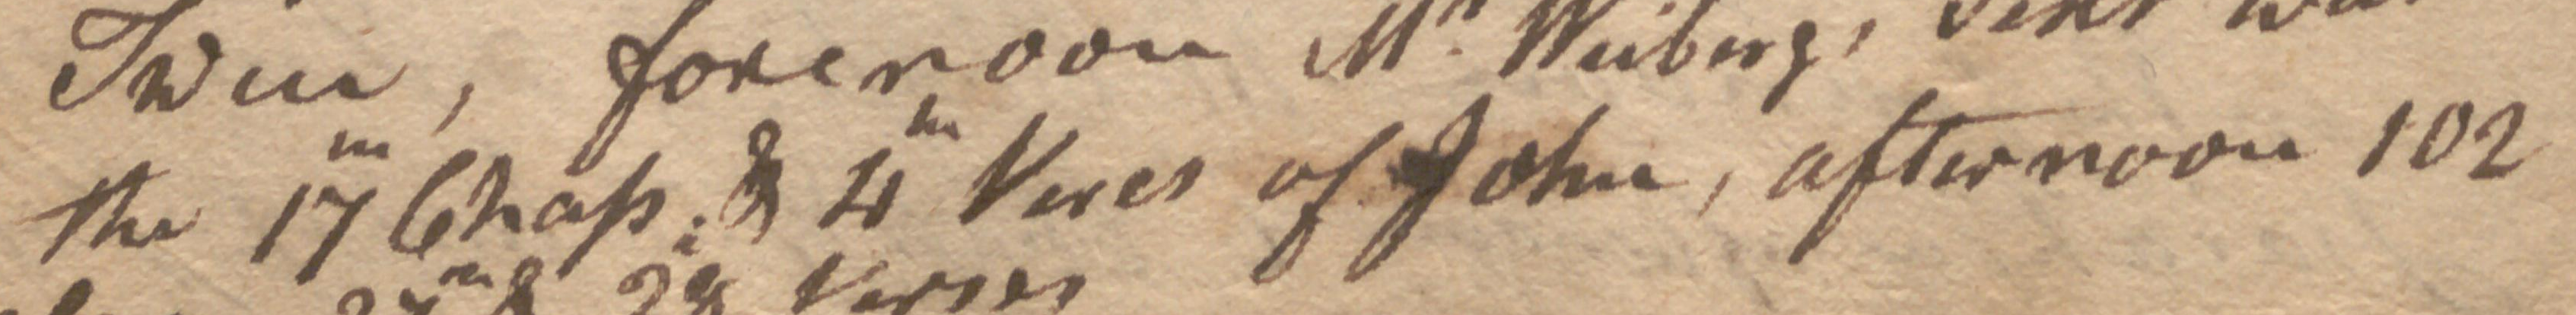the 17^th Chaps. & 4^th Veres of John, afternoon 102
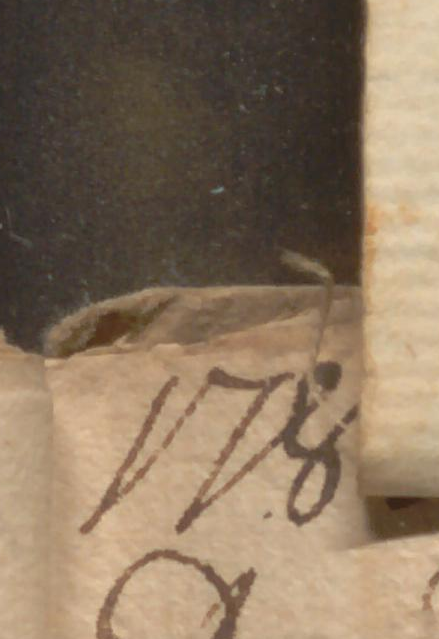178
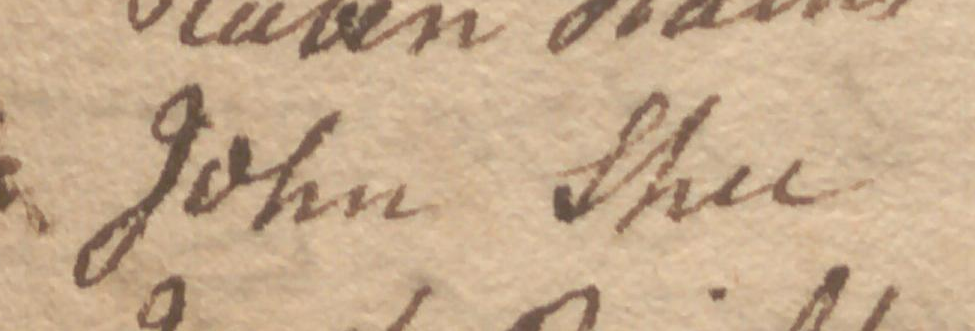John Shee
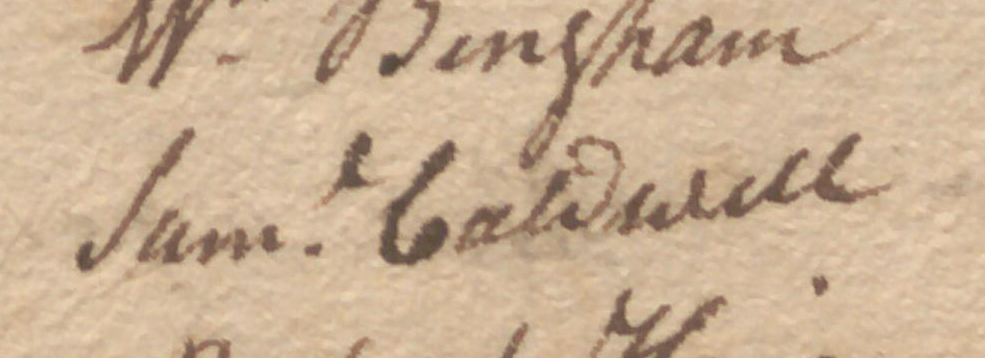Sam^l. Caldwell
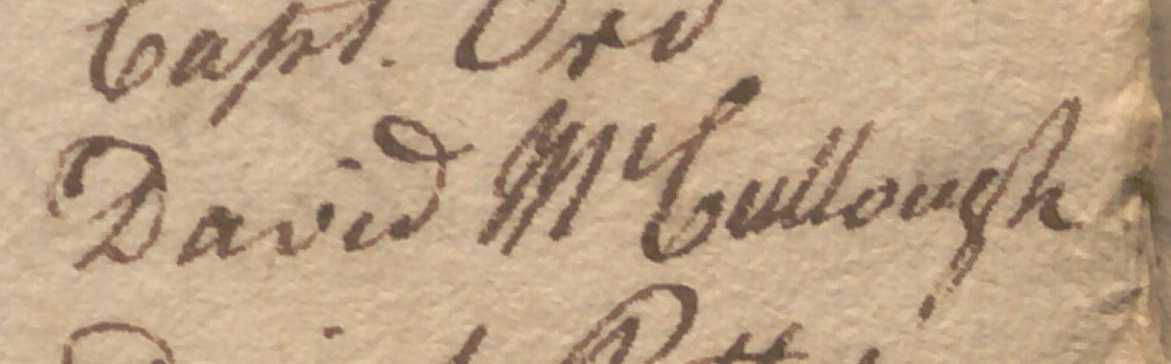David M^cCullough
